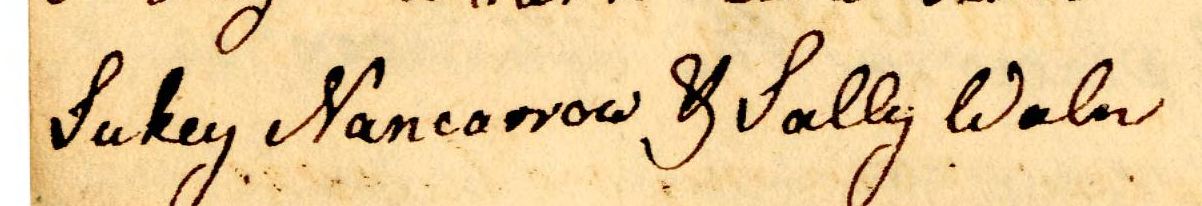Sukey Nancarrow & Sally Waln
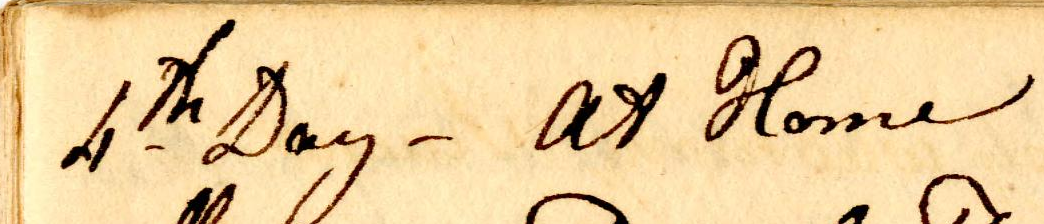4^th Day- At Home
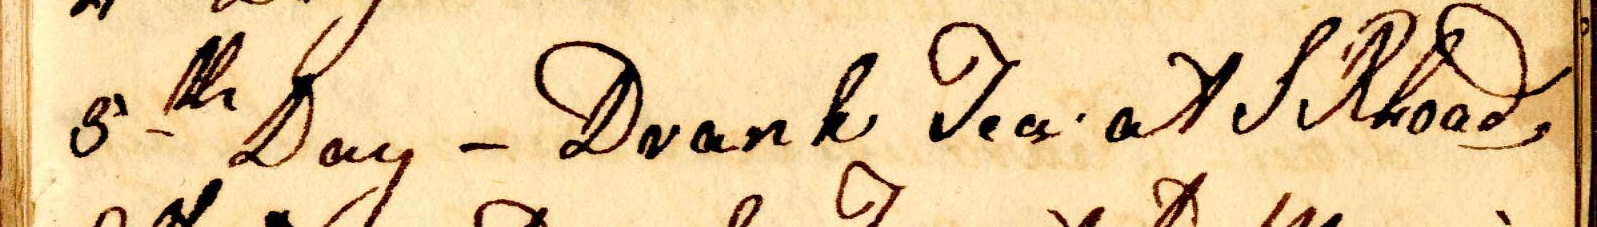5^th Day- Drank Tea at S. Rhoads
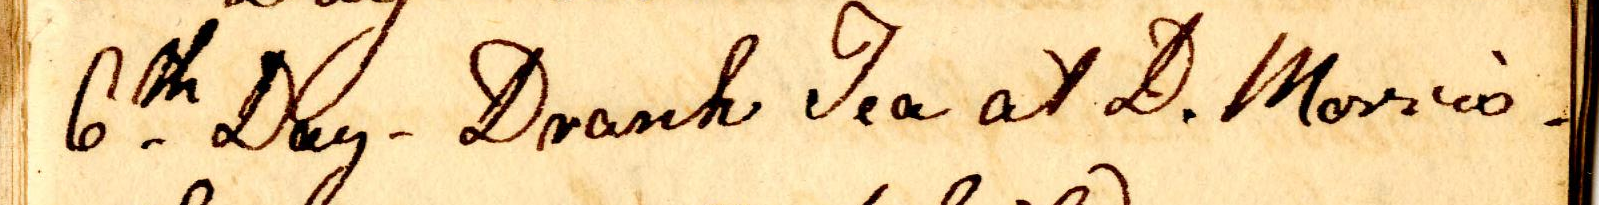6^th Day- Drank Tea at D. Morris
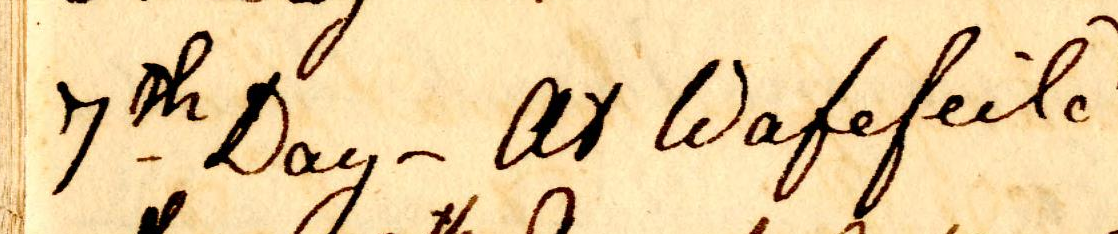7^th Day- At Wafefeild
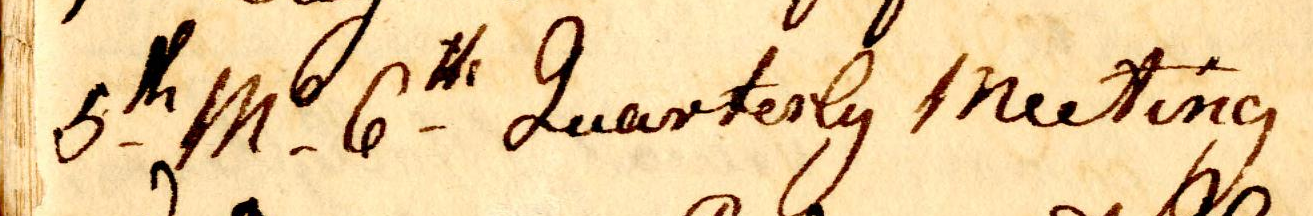5^th M^o 6^th Quarterly Meeting
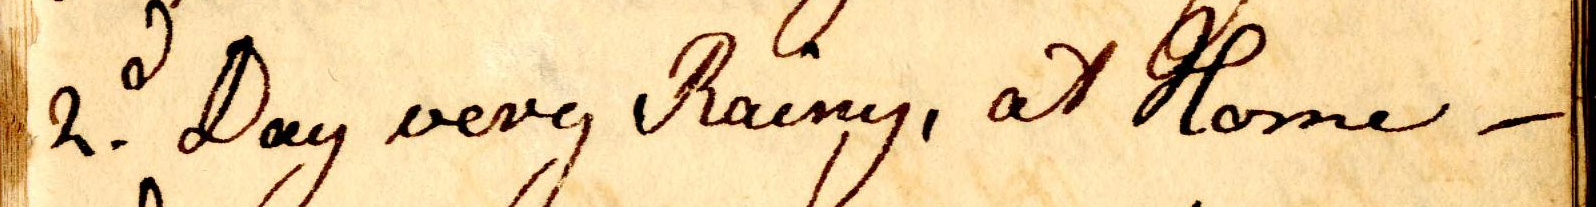2^d. Day very Rainy, at Home-
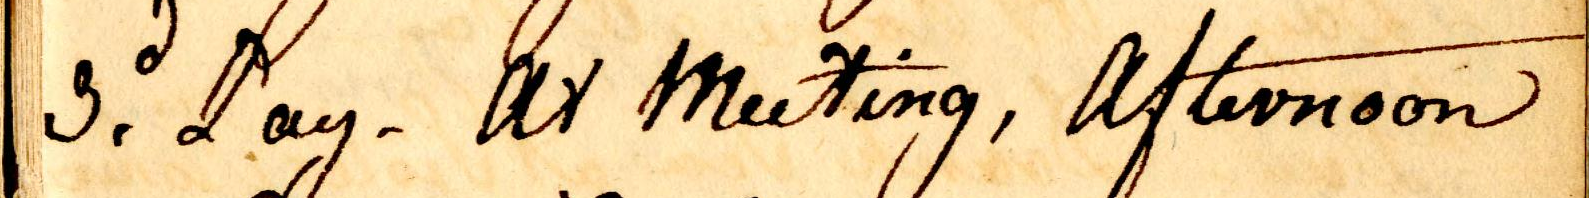3^d. Day- At Meeting, Afternoon
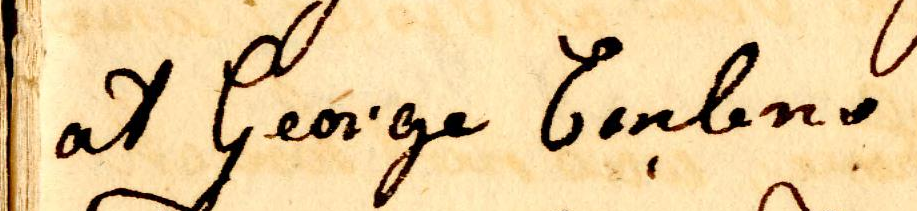at George Emlens
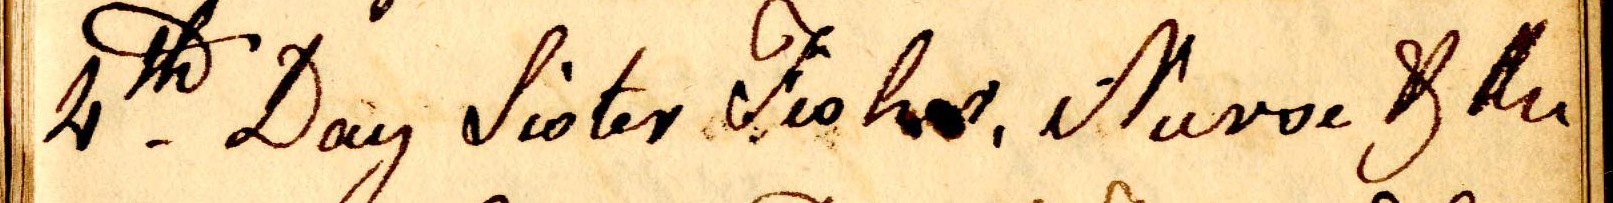4^th Day Sister Fisher, Nurse & the
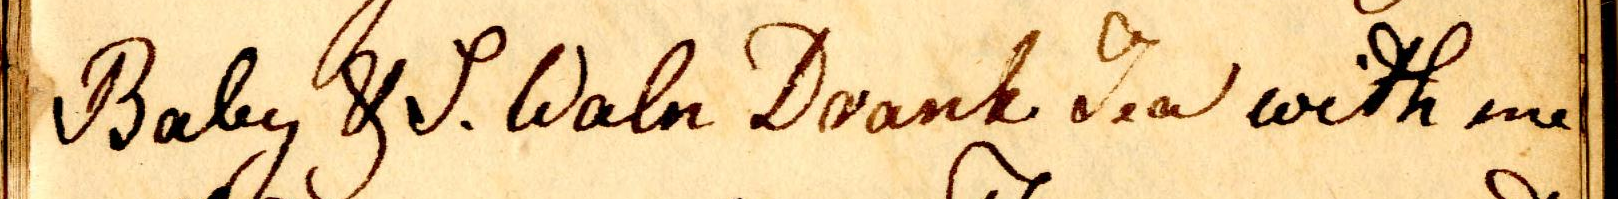Baby & S. Waln Drank Tea with me
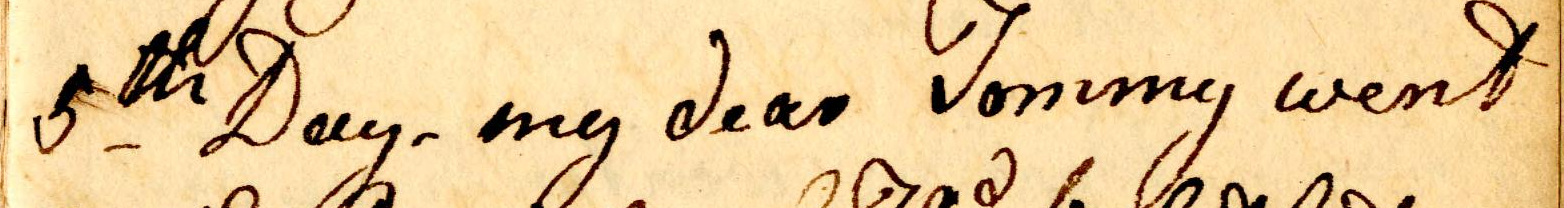5^th Day- my dear Tommy went
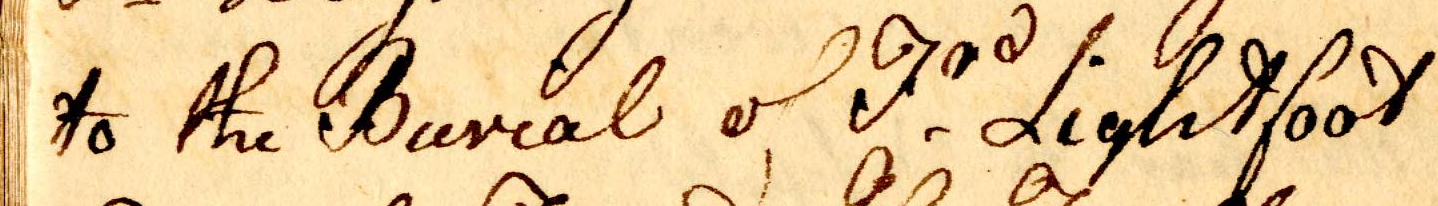to the Burial of F^rd Lightfoot
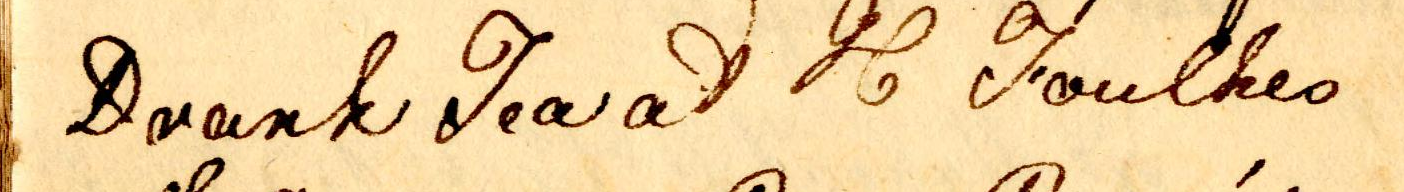Drank Tea at H Foulkes
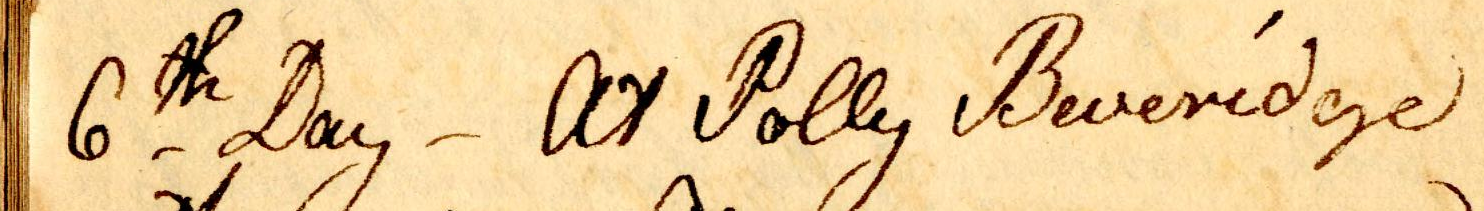6^th Day- At Polly Beveridge
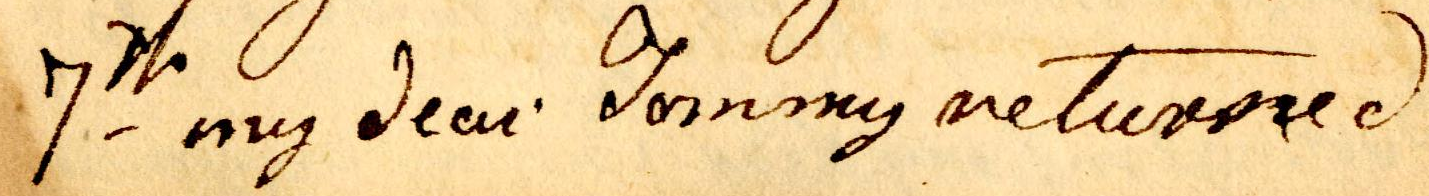7^th my dear Tommy returned
